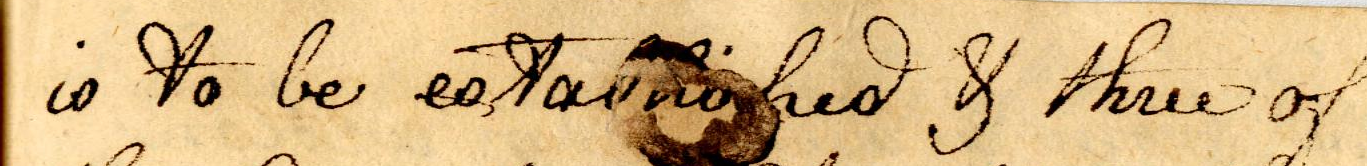is to be established & three of ^69
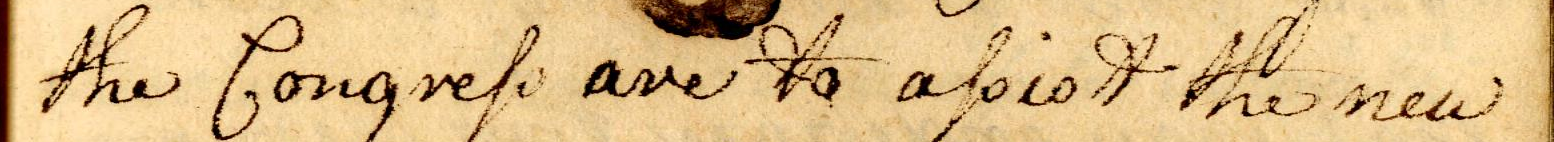the Congress are to assist the new
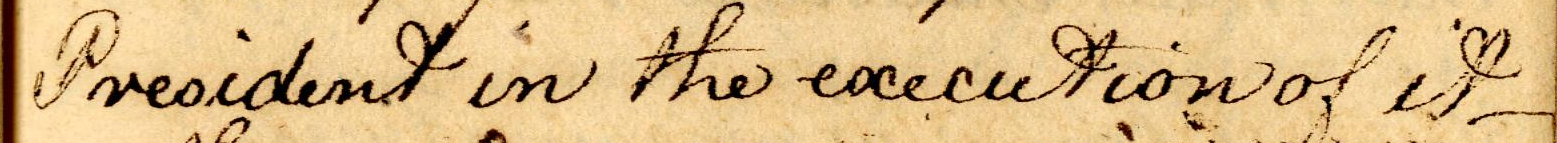President in the execution of it-
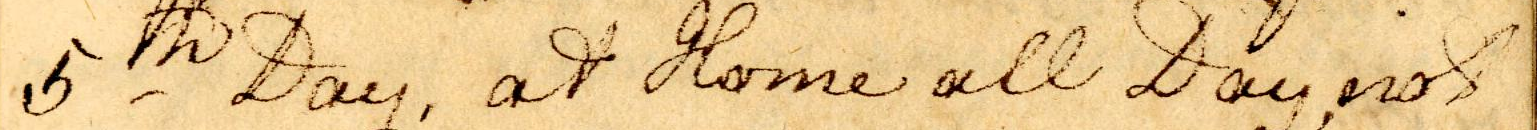5^th Day, at Home all Day not
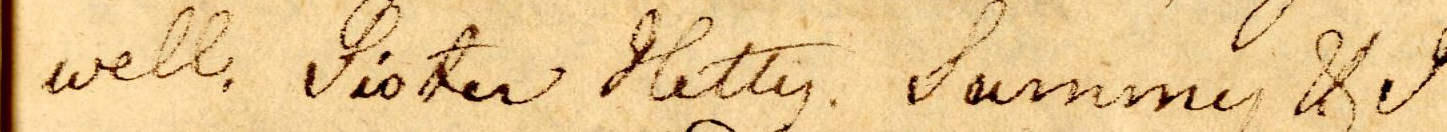well, Sister Hetty. Sammy & I
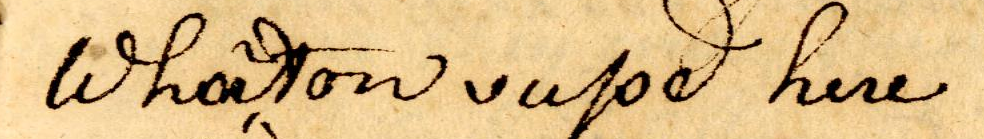Wha^rton supd here
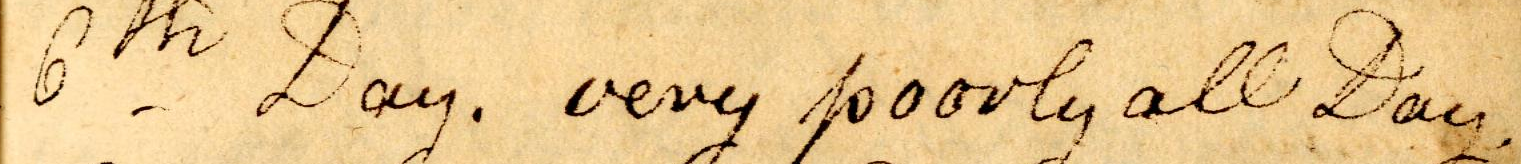6^th Day. very poorly all Day,
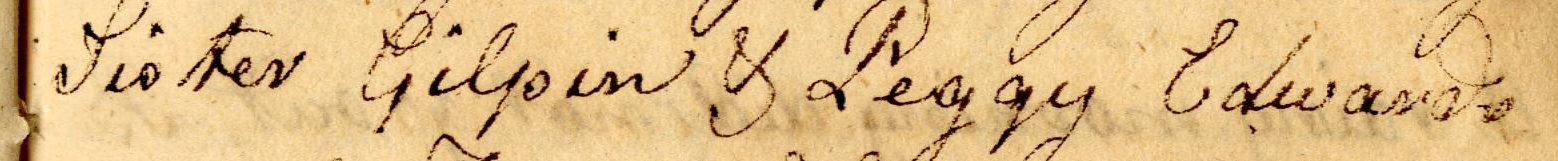Sister Gilpin & Peggy Edwards
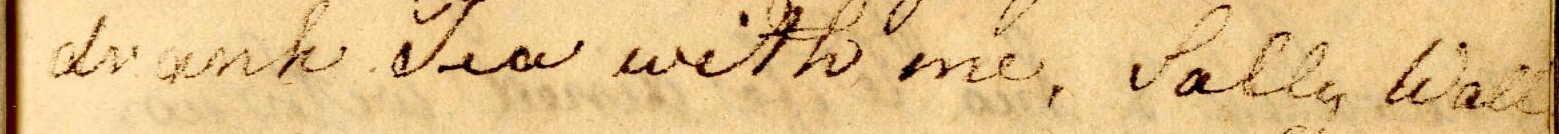drank Tea with me, Sally Wall
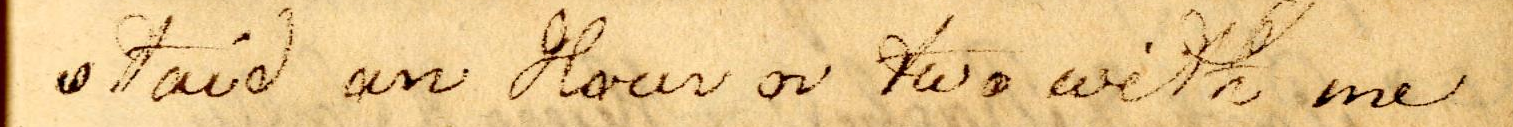staid an Hour or two with me
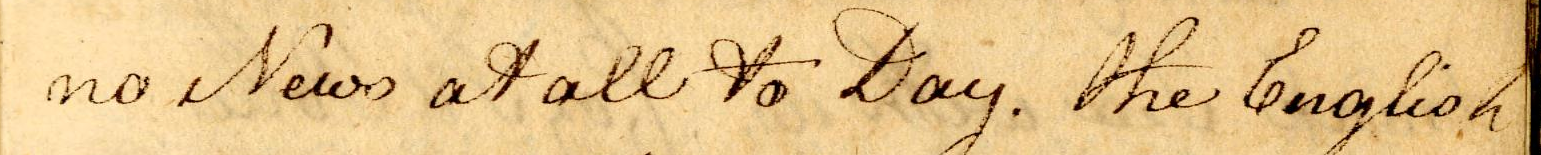no News at all to Day. the English
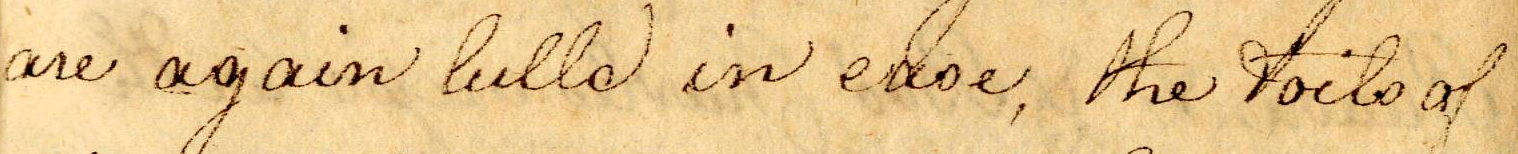are again lulld in ease, the toils of
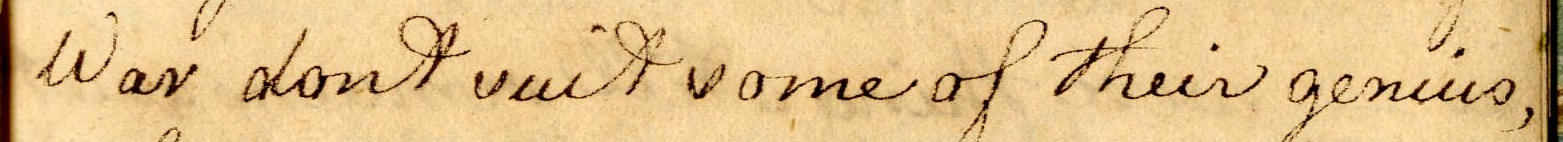War dont suit some of their genius,
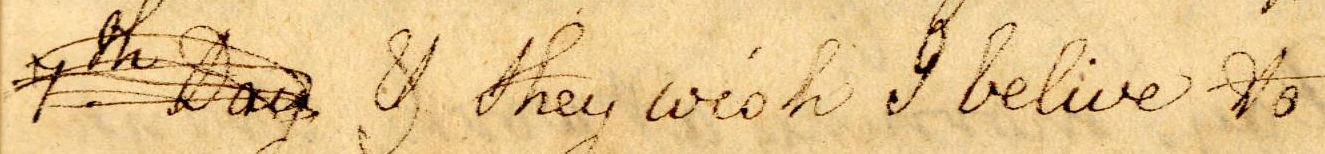[7^th. Day] & they wish I belive to
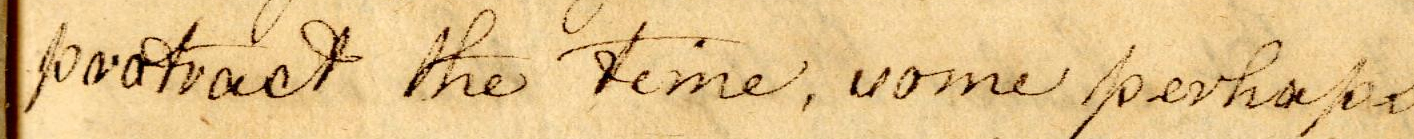protect the time some perhaps
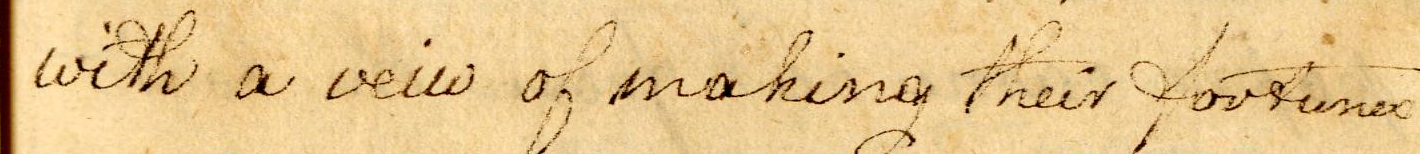with a veiw of making their fortunes
